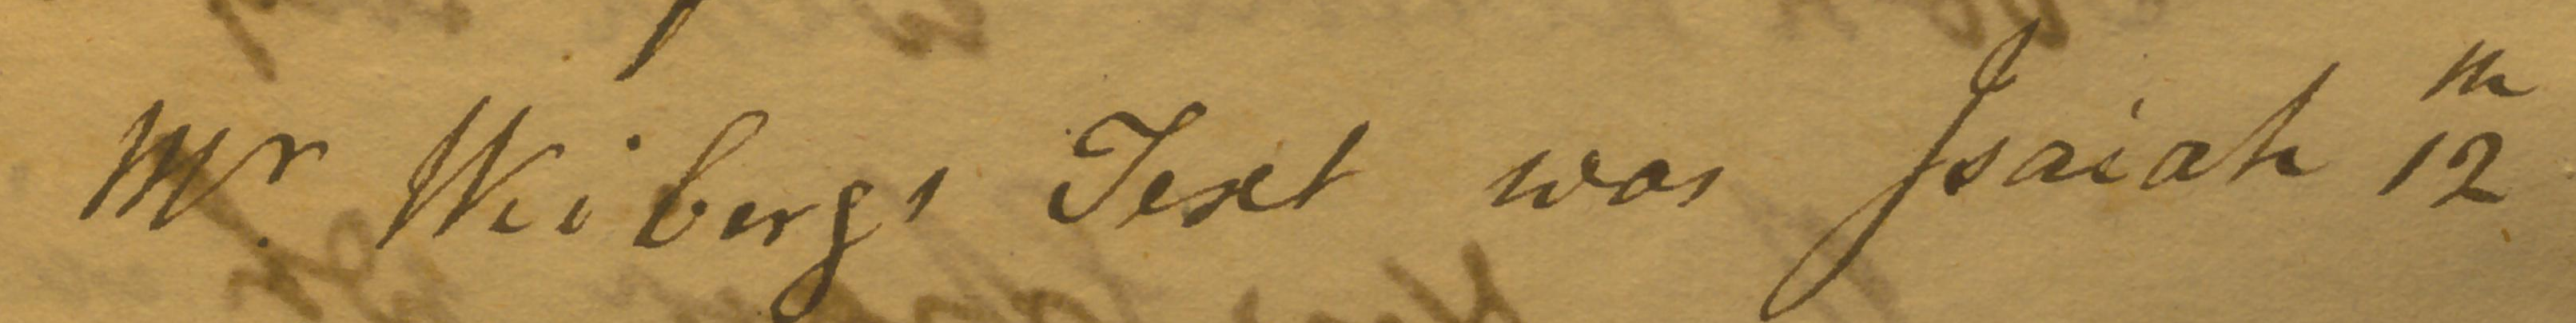M^r. Weibergs Text was Isaiah 12^th
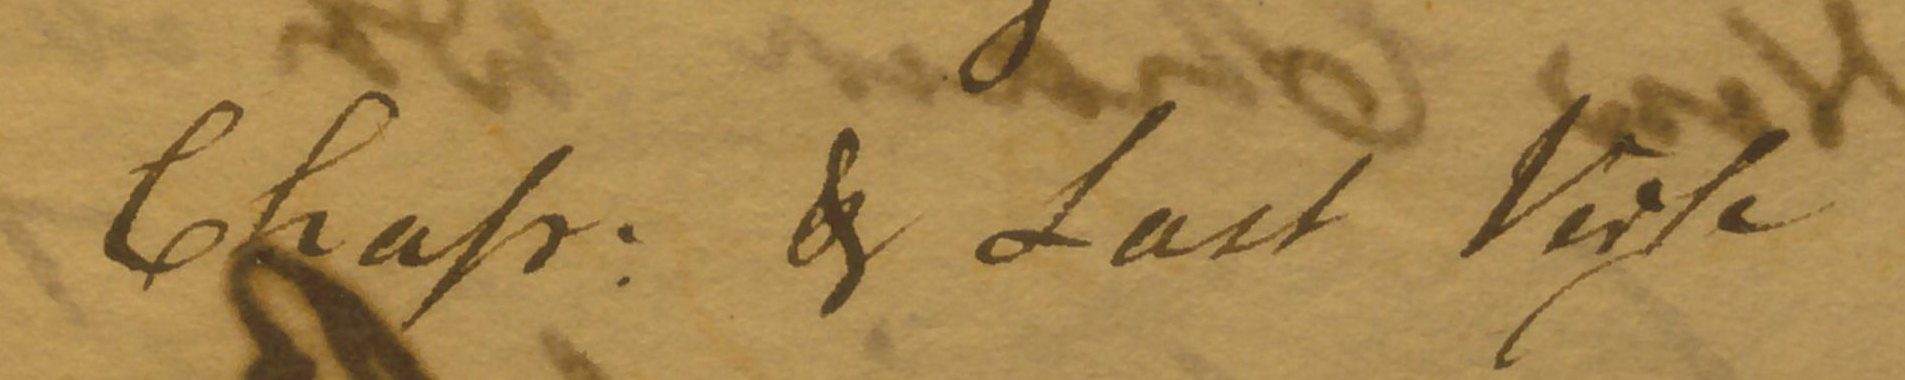Chap. & Last Verse
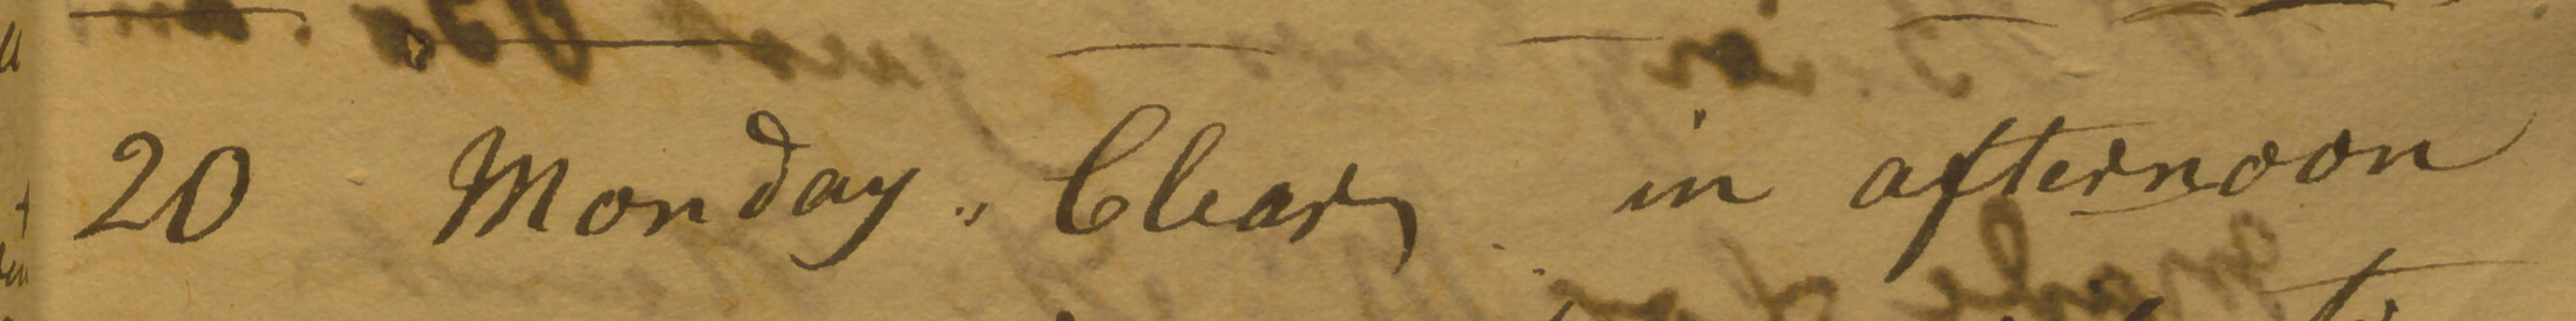20 Monday. Clear in afternoon
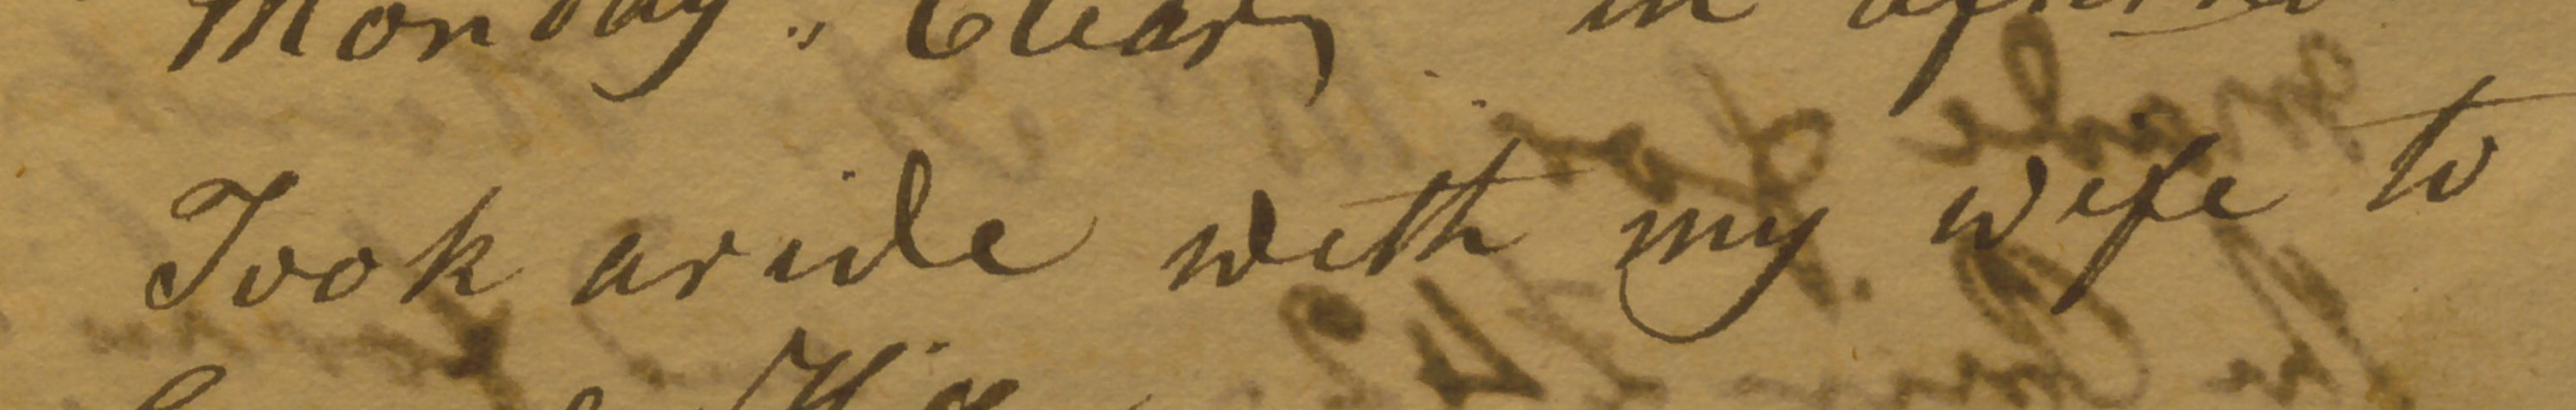Took a ride with my wife to
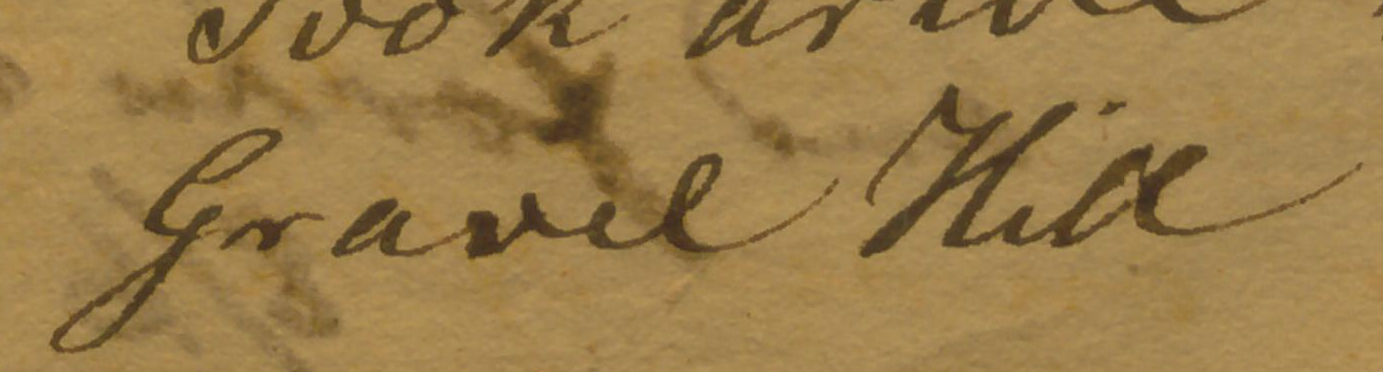Gravel Hill
